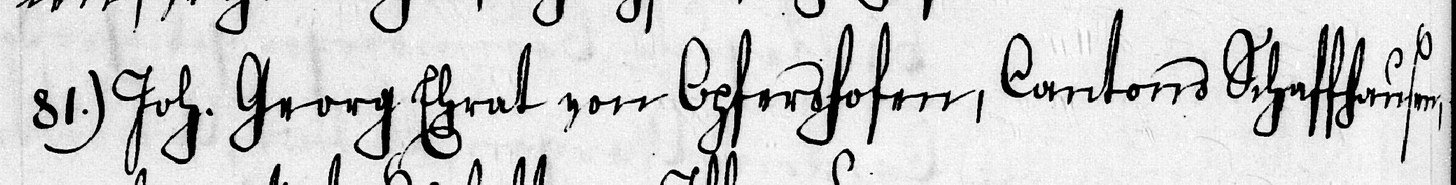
81.) Joh. Georg Ehrat von Opfershofen, Cantons Schaffhaus¬
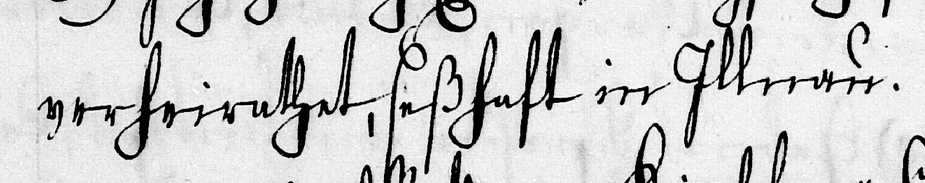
verheirathet, seßhaft in Illnau.
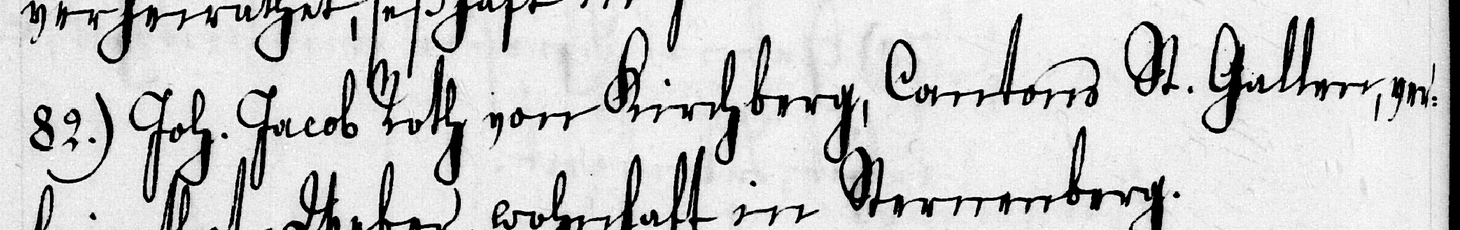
82.) Joh. Jacob Roth von Kirchberg, Cantons St. Gallen, v¬
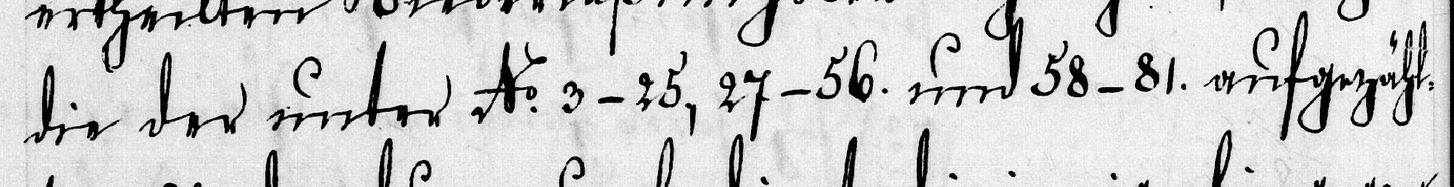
die der unter No. 3–25, 27–56. und 58–81 aufgezähl¬
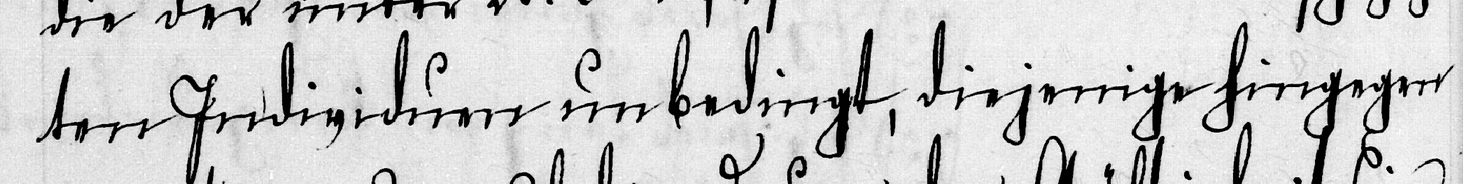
ten Individuen unbedingt, diejenige hingegen
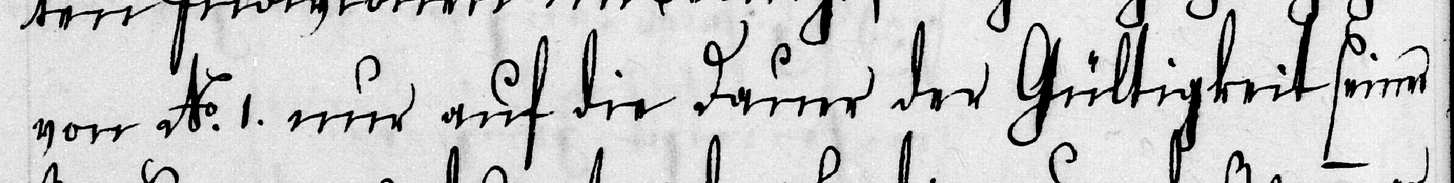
von No. 1 nur auf die Dauer der Gültigkeit seines
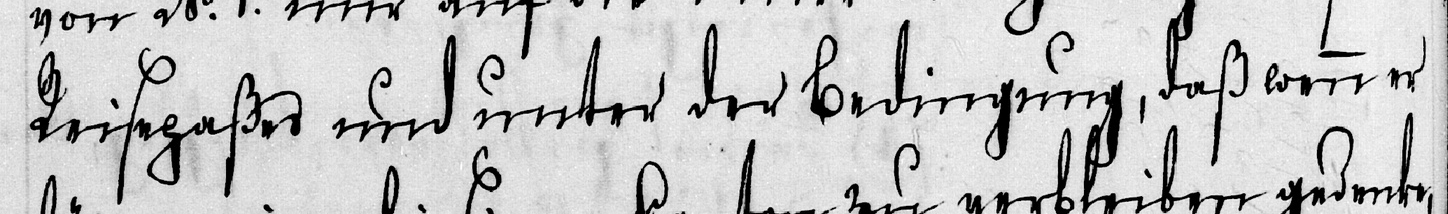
Reisepaßes und unter der Bedingung, daß wenn er
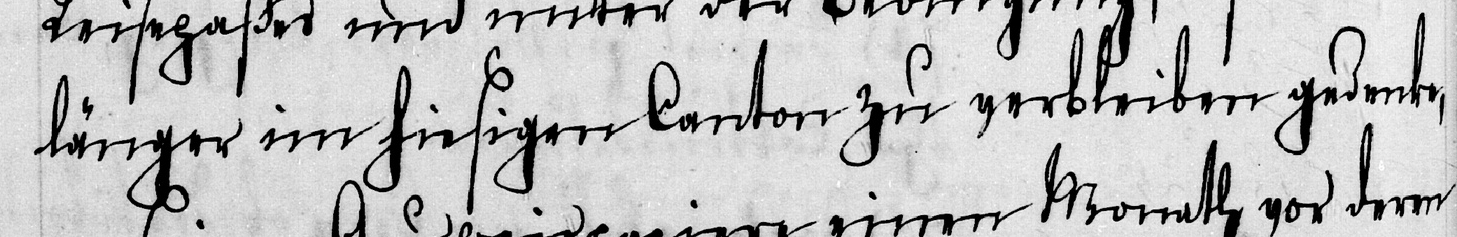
länger im hiesigen Canton zu verbleiben gedenk¬
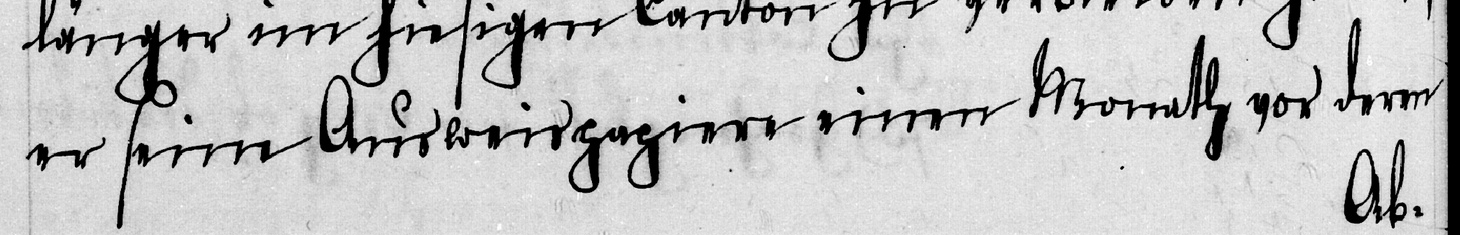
er seine Ausweispapiere einen Monath vor deren
